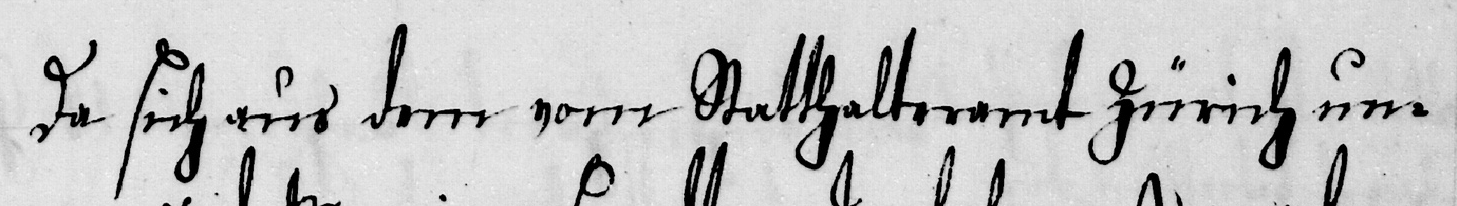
Da sich aus dem vom Statthalteramt Zürich un¬
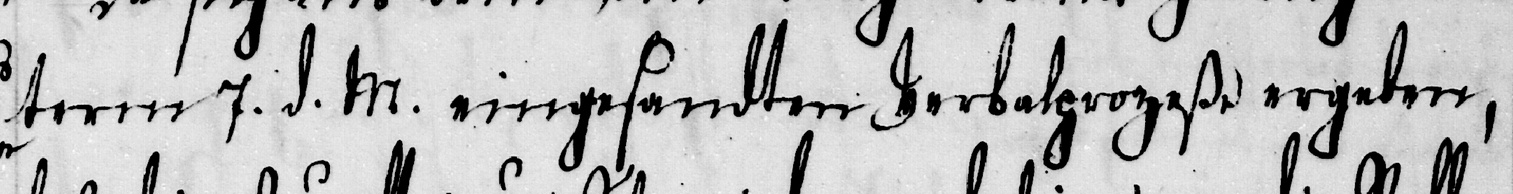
term 7. d. M. eingesandten Verbalprozeße ergeben,
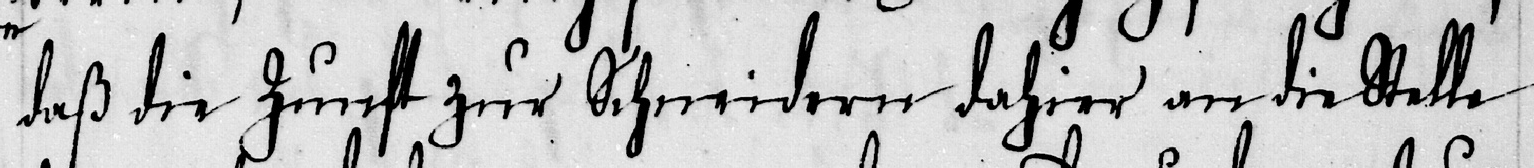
daß die Zunft zur Schneidern dahier an die Stelle
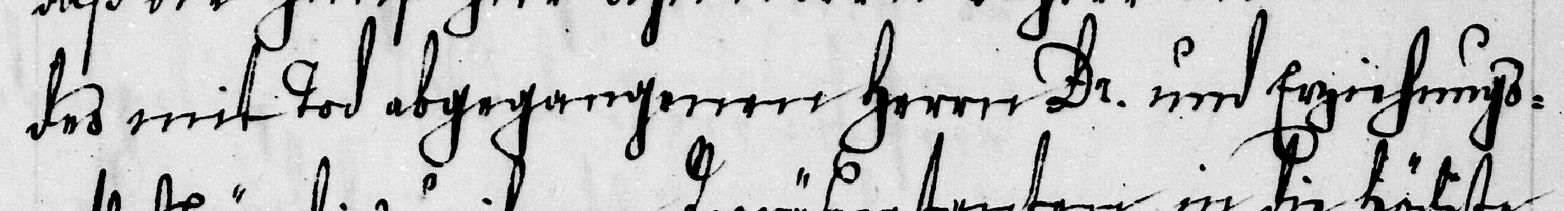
des mit Tod abgegangenen Herrn Dr. und Erziehungs¬
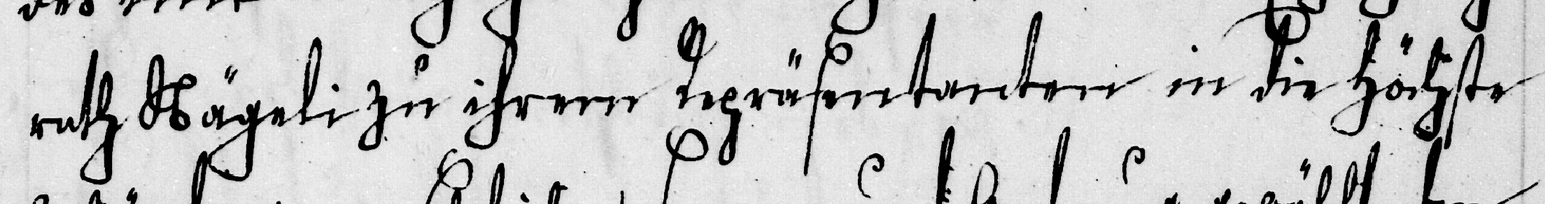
rath Nägeli zu ihrem Repräsentanten in die höchste
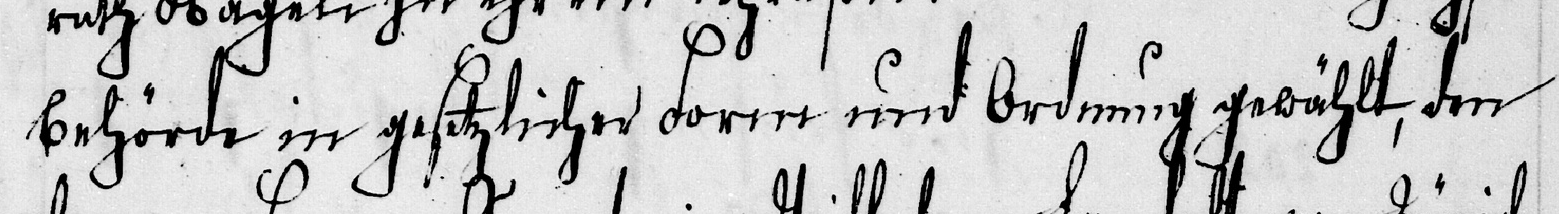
Behörde in gesetzlicher Form und Ordnung gewählt, den
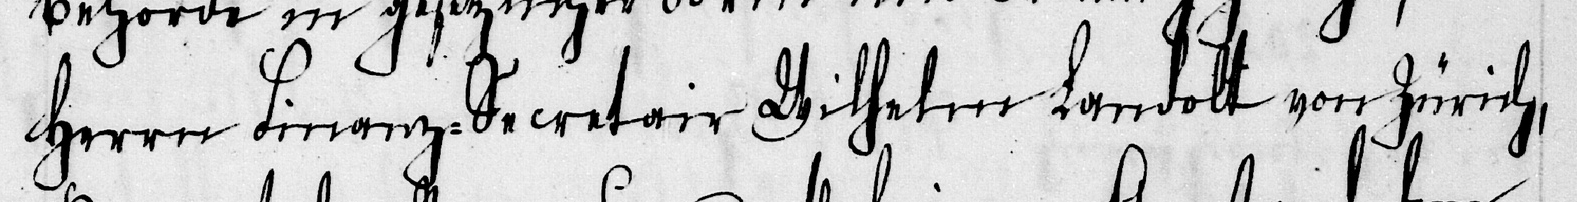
Herrn Finanz-Secretair Wilhelm Landolt von Zürich,
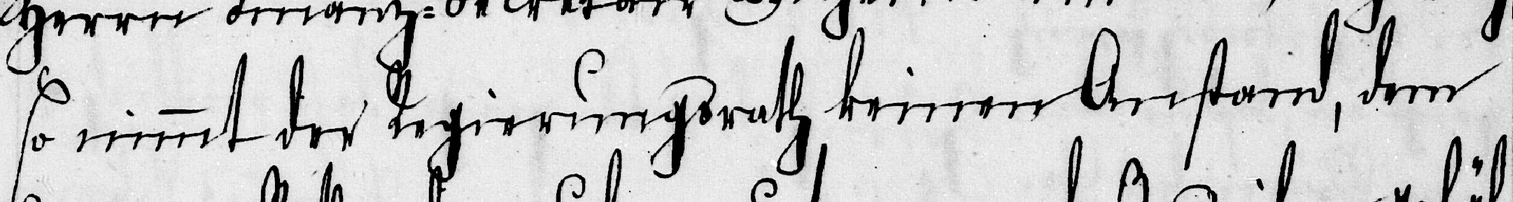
so nimmt der Regierungsrath keinen Anstand, dem
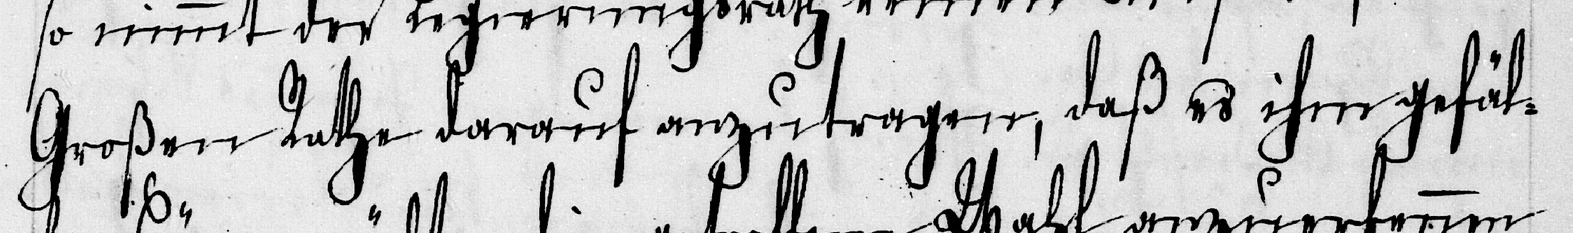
Großen Rathe darauf anzutragen, daß es ihm gefäl¬
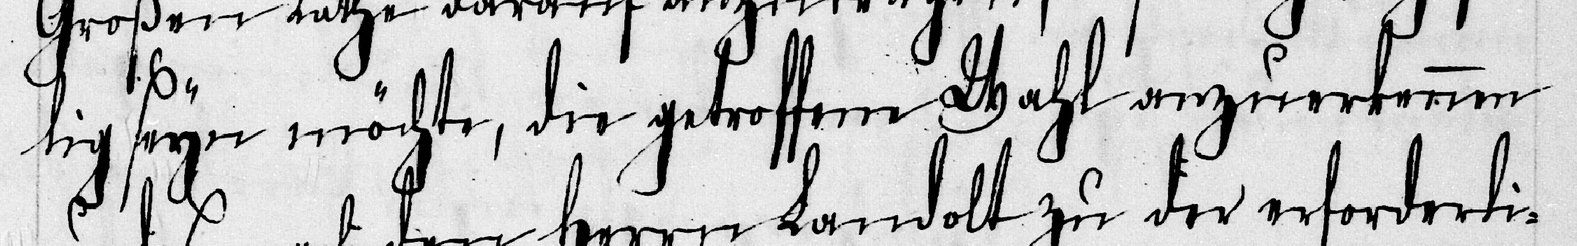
lig seyn möchte, die getroffene Wahl anzuerkennen
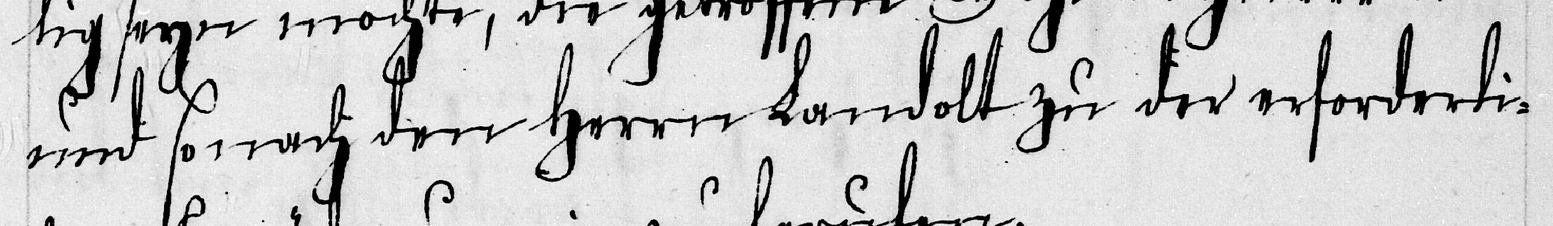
und sonach den Herrn Landolt zu der erforderli¬
